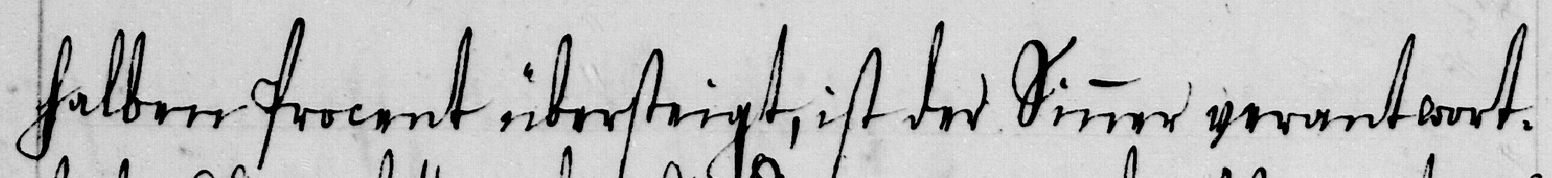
halben Prozent übersteigt, ist der Sinner verantwort¬
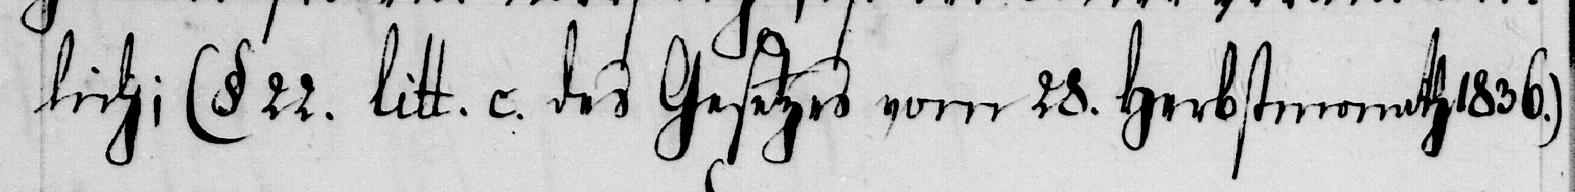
lich; (§ 22. litt. c. des Gesetzes vom 28. Herbstmonath 1836.)
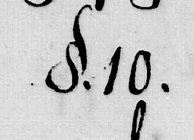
§. 10.
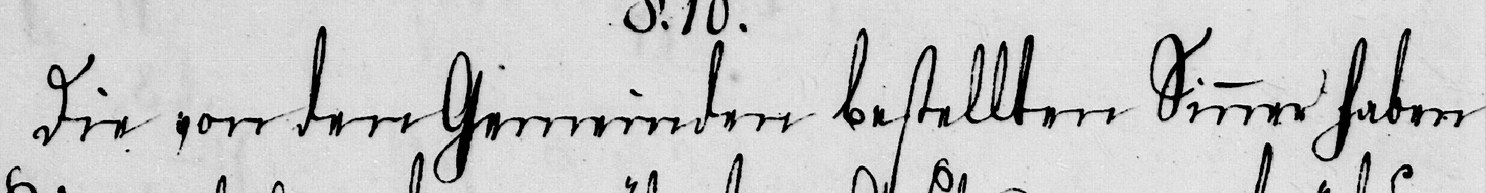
Die von den Gemeinden bestellten Sinner haben
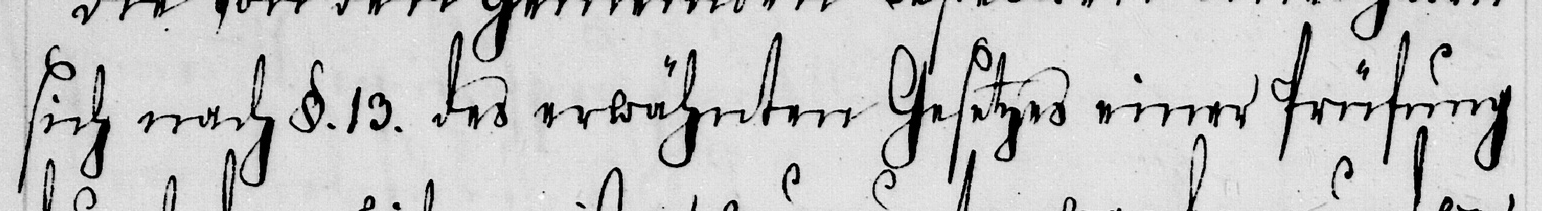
sich nach §. 13. des erwähnten Gesetzes einer Prüfung
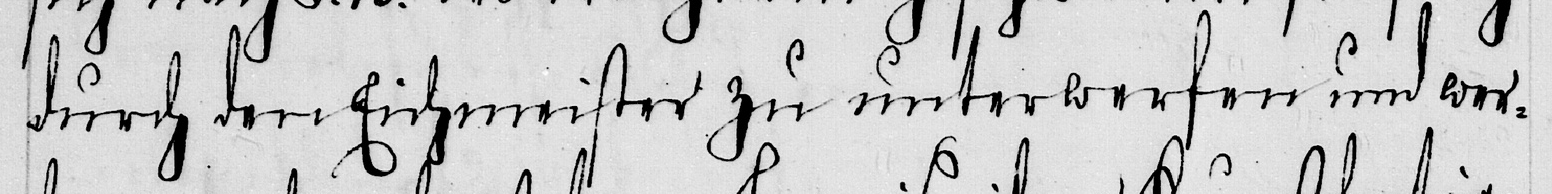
durch den Eichmeister zu unterwerfen und wer¬
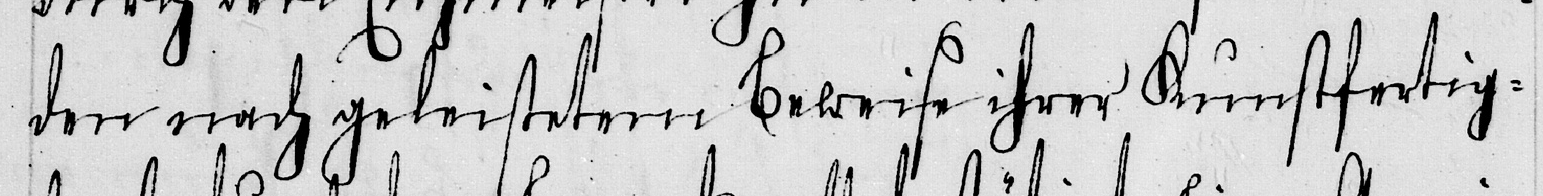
den nach geleistetem Beweise ihrer Kunstfertig¬
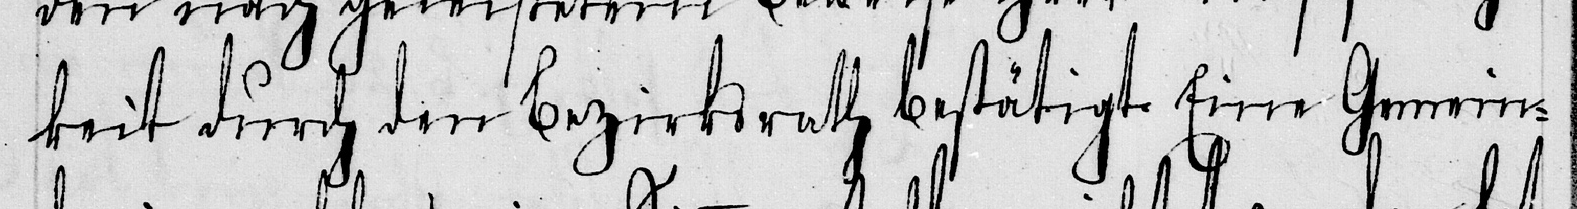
keit durch den Bezirksrath bestätigt. Eine Gemein¬
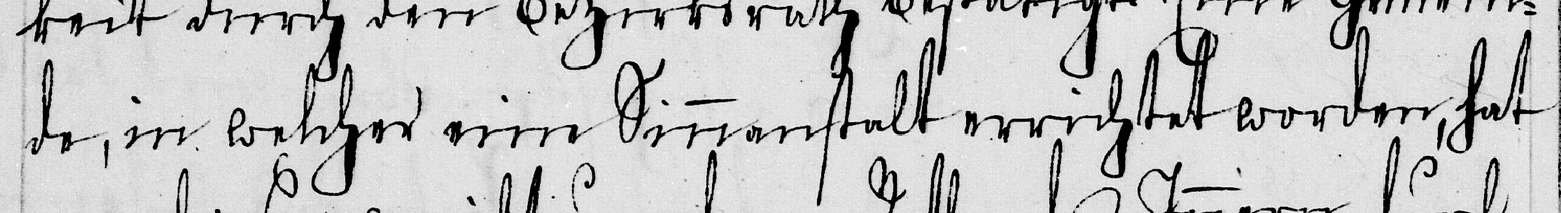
de, in welcher eine Sinnanstalt errichtet worden, hat
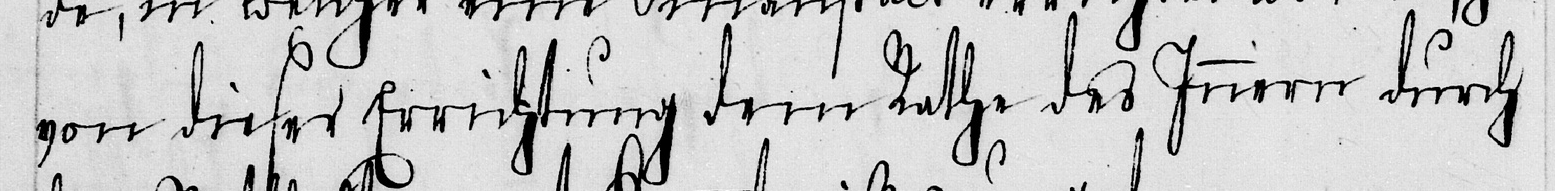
von dieser Errichtung dem Rathe des Innern durch
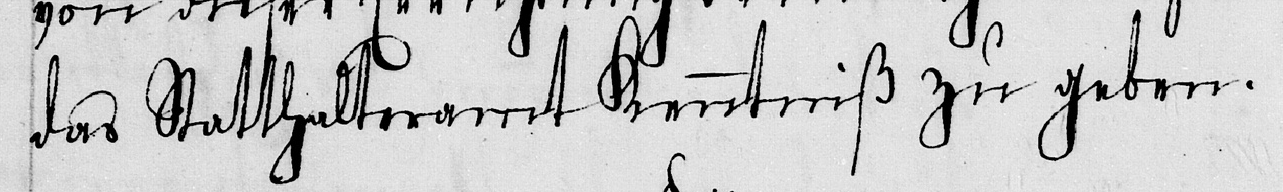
das Statthalteramt Kenntniß zu geben.
